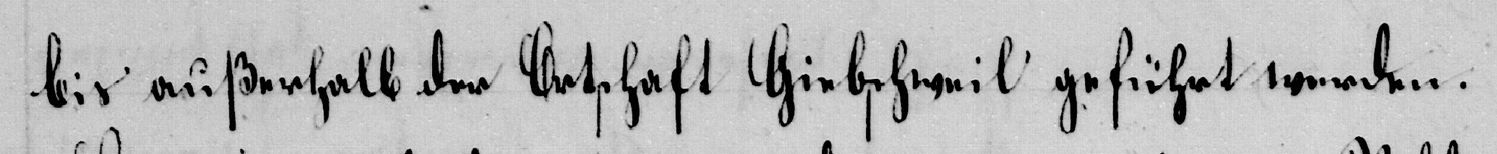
bis außerhalb der Ortschaft Giebschweil geführt werden.
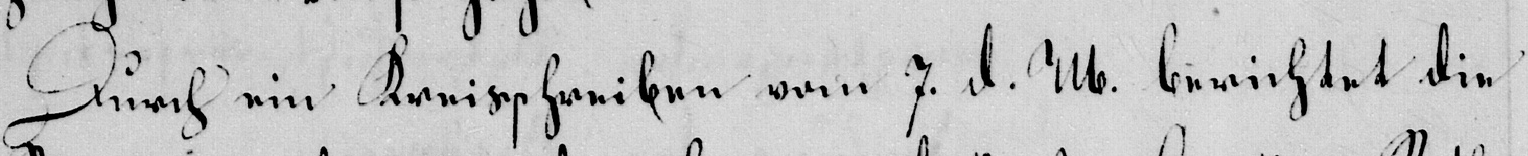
Durch ein Kreisschreiben vom 7. d. M. berichtet die
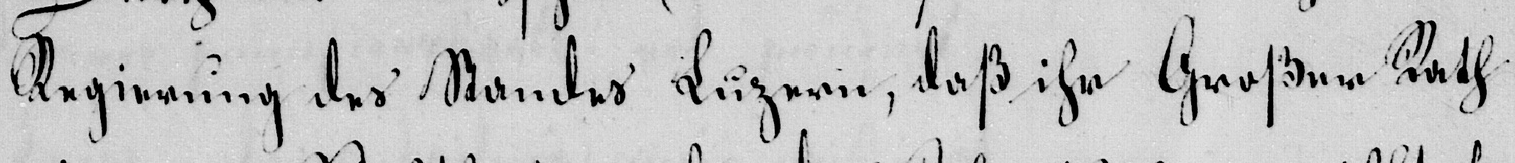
Regierung des Standes Luzern, daß ihr Großer Rath
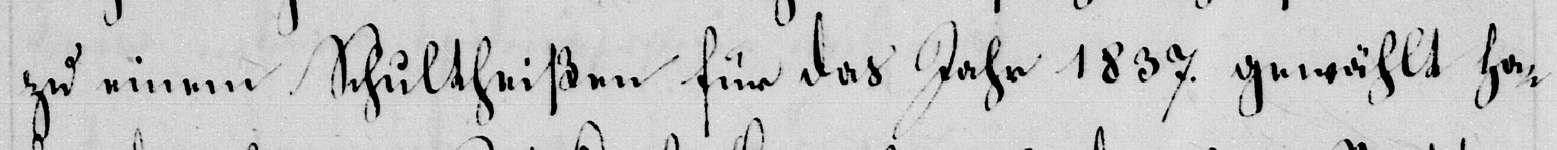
zu einem Schultheißen für das Jahr 1837. gewählt ha¬
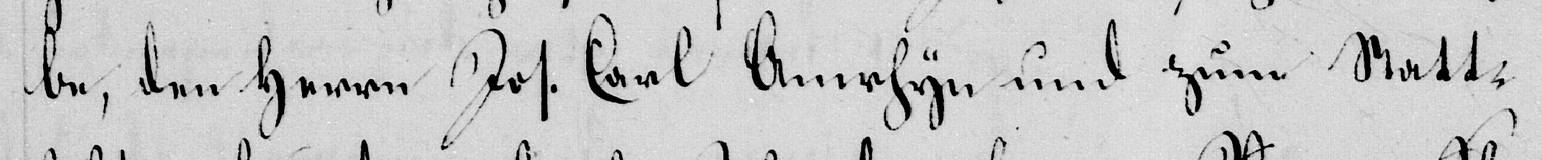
be, den Herrn Jos. Carl Anerhyn und zum Statt¬
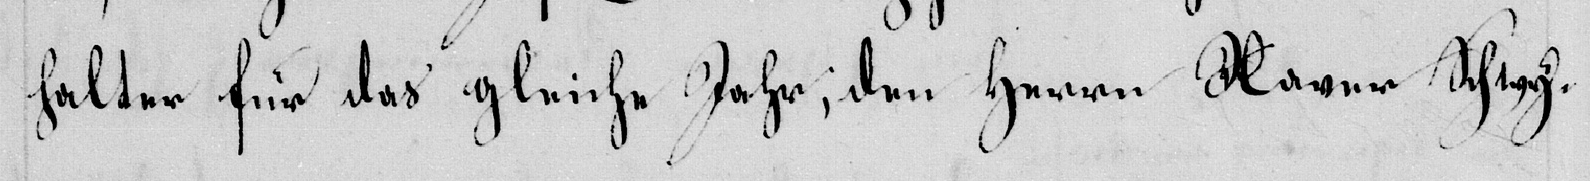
halter für das gleiche Jahr, den Herrn Xaver Schwy¬
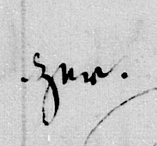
zer.
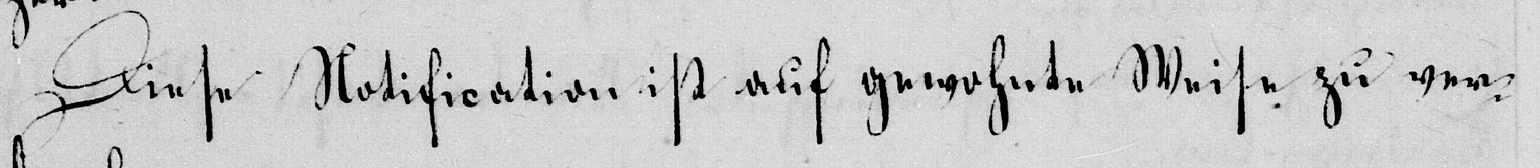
Diese Notification ist auf gewohnte Weise zu ver¬
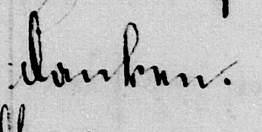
danken.
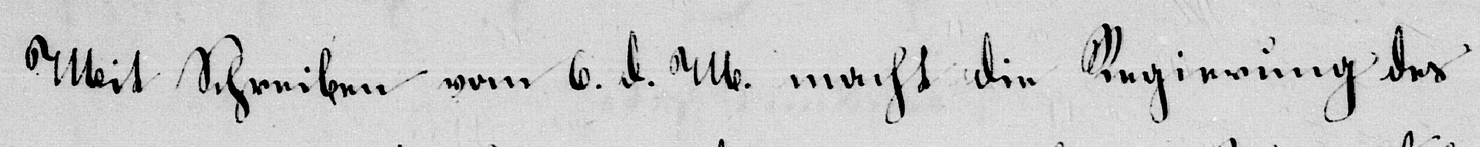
Mit Schreiben vom 6. d. M. macht die Regierung des
